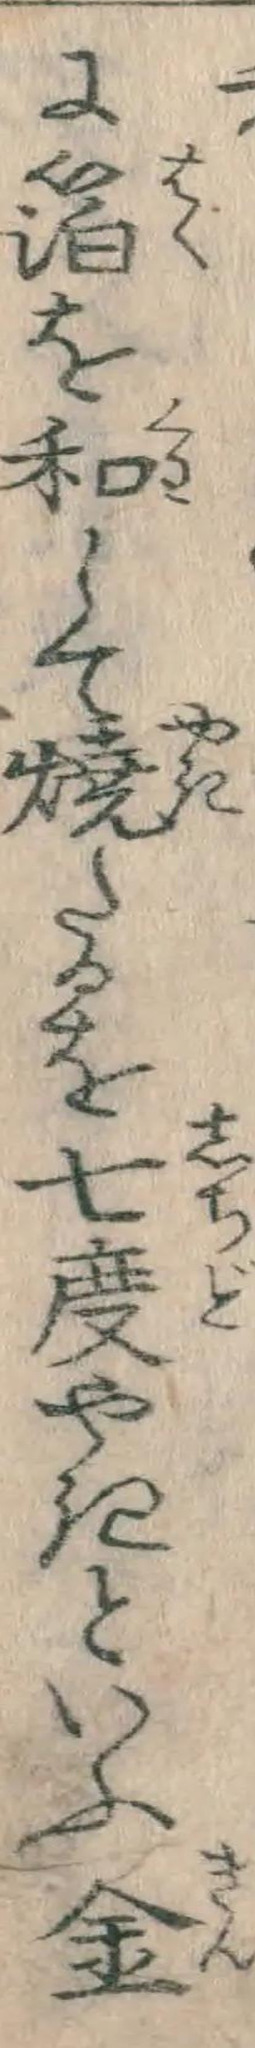に箔を和して焼たるを七度やきといふ金

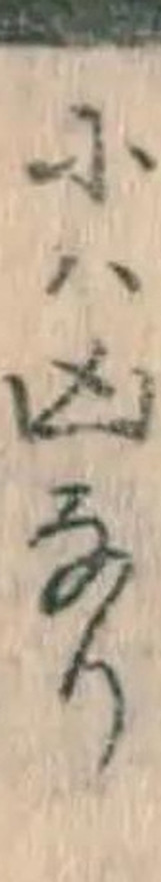には凶なり
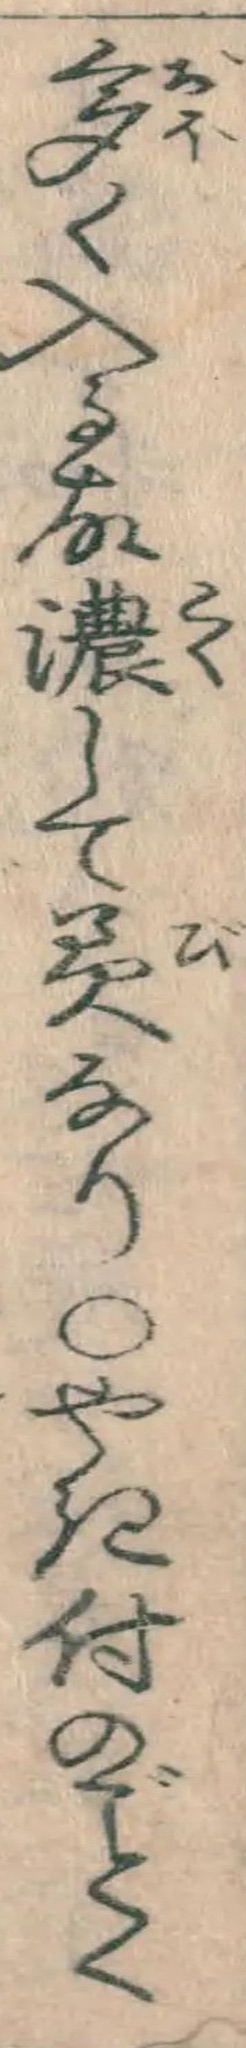多く入る故濃して美なり○やき付のごとく
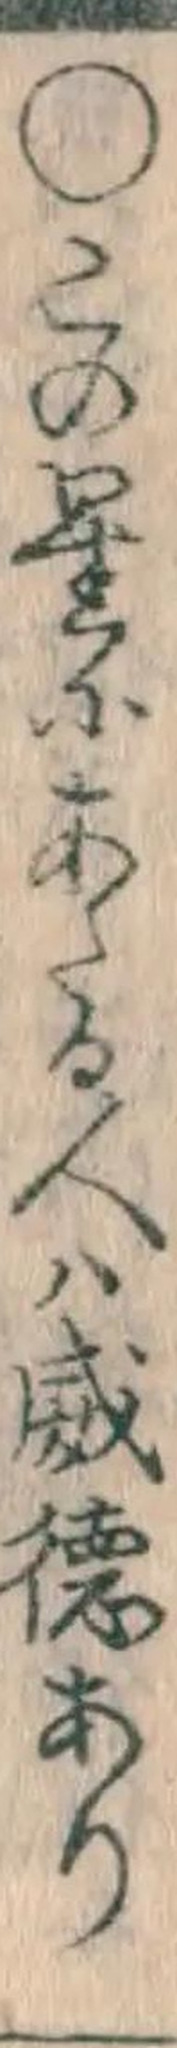○この星にあたる人は威徳あり
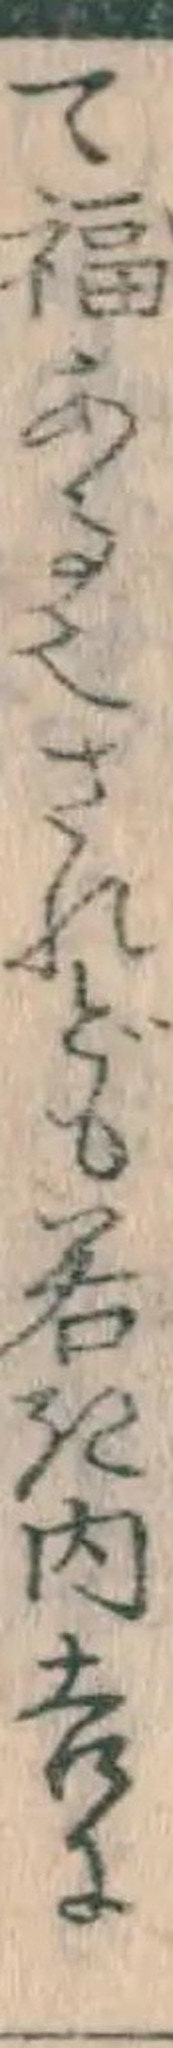て福ある也されども若き内吉に
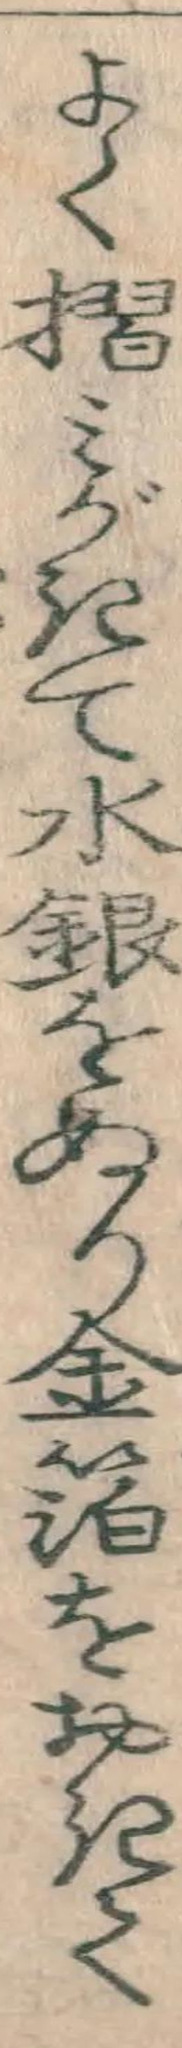よく摺みがきて水銀をぬり金箔をおきて
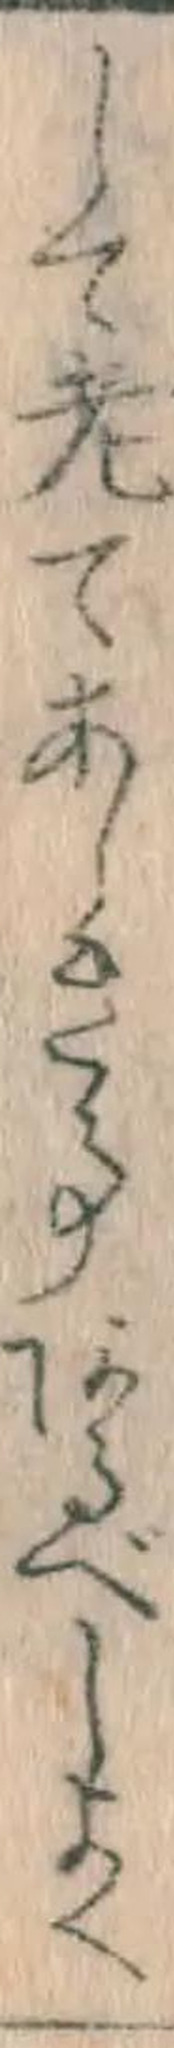して老てあしき事あるべしよく
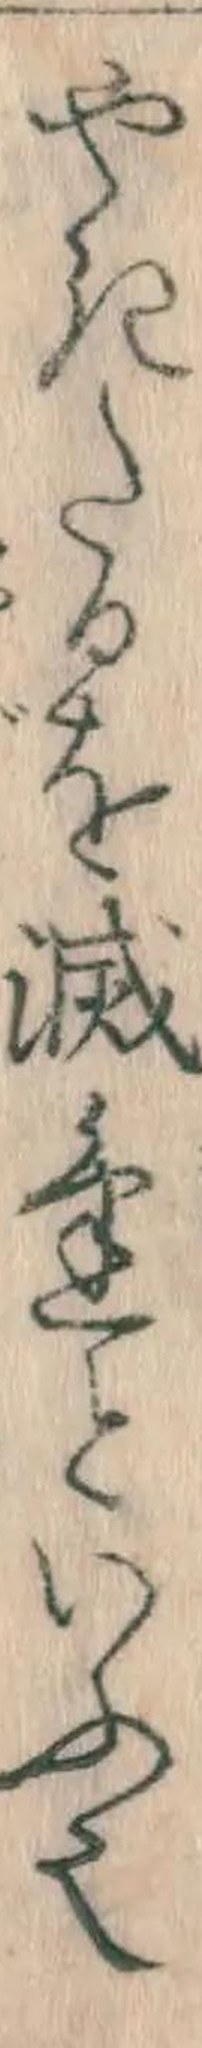やきたるを滅金といふ也
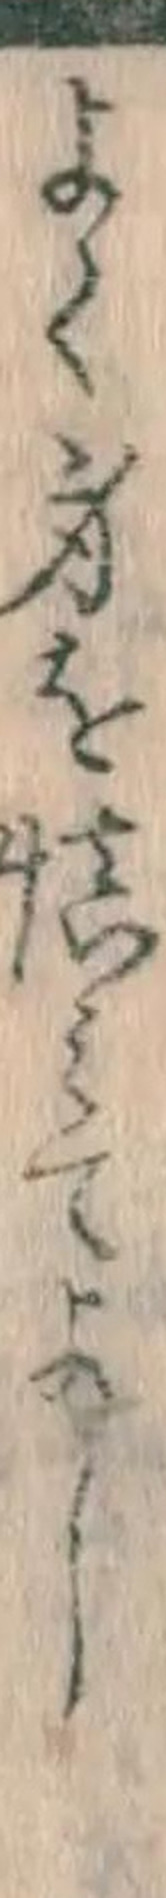よく身を慎みてよし
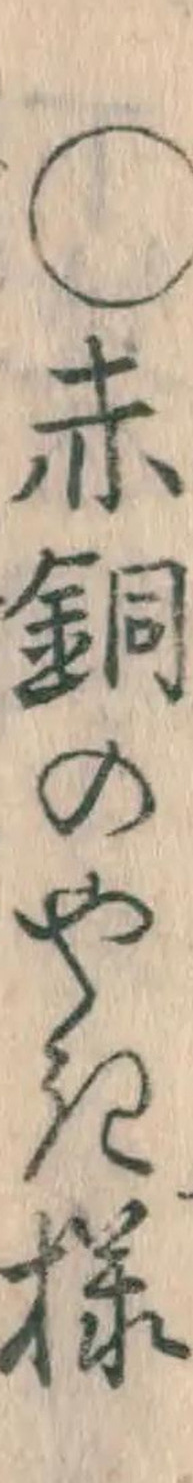○赤銅のやき様
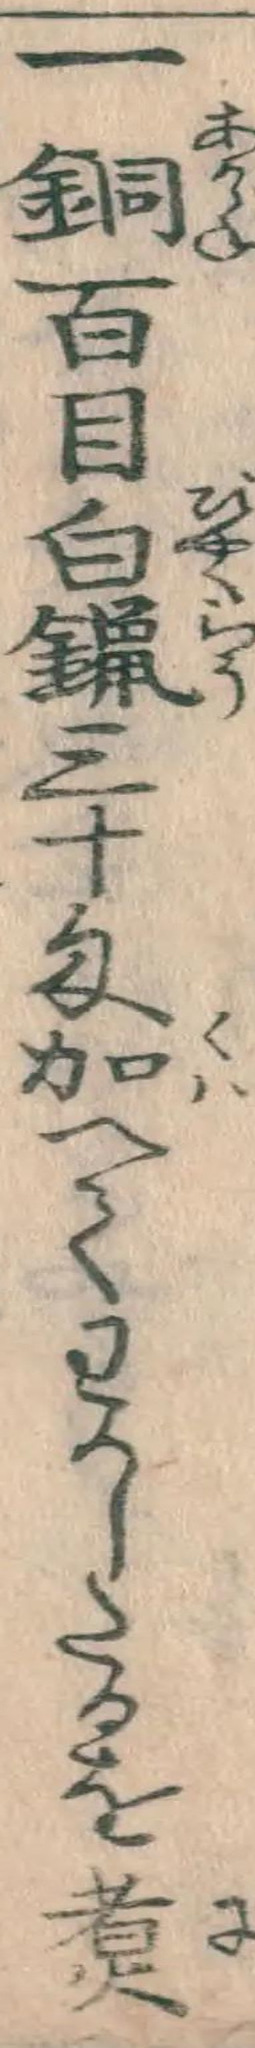一銅百目白鑞三十匁加へてわかしたるを煮
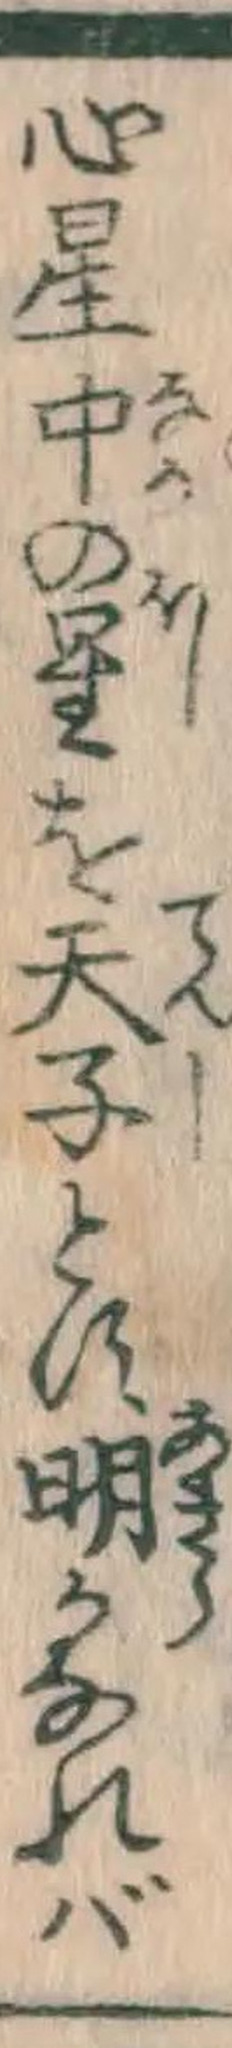此星中の星を天子とす明かなれば
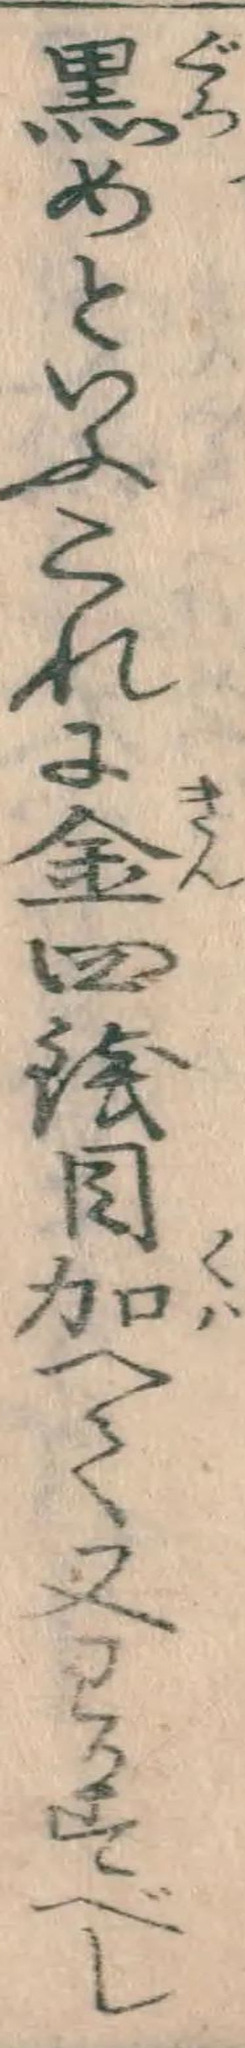黒めといふこれに金四銭目加へて又わかすべし
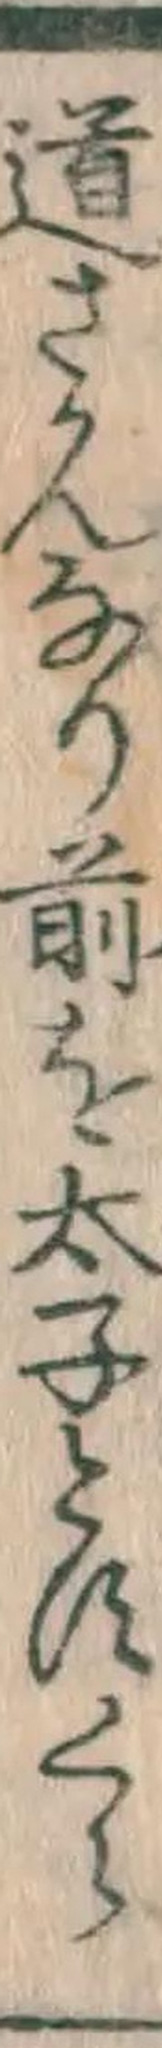道さかんなり前を太子とすくら
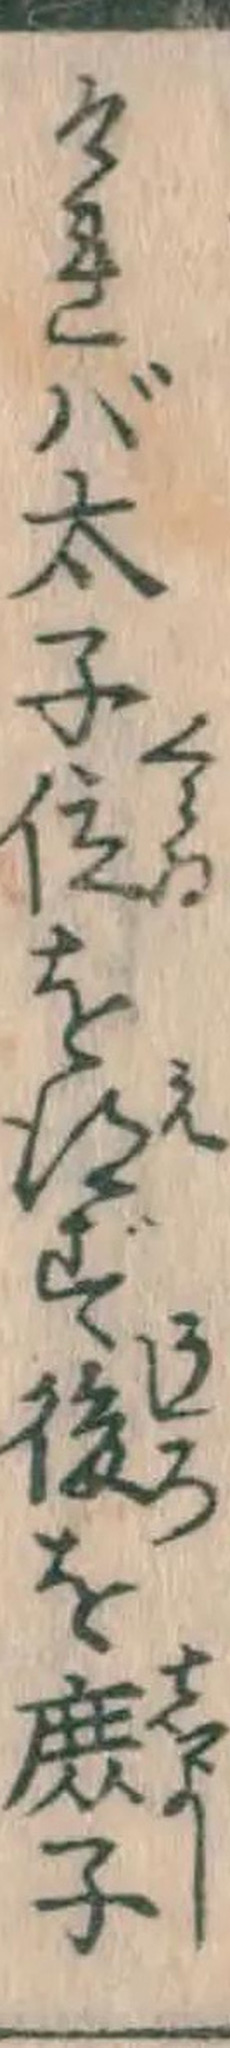ければ太子位を得ず後を庶子
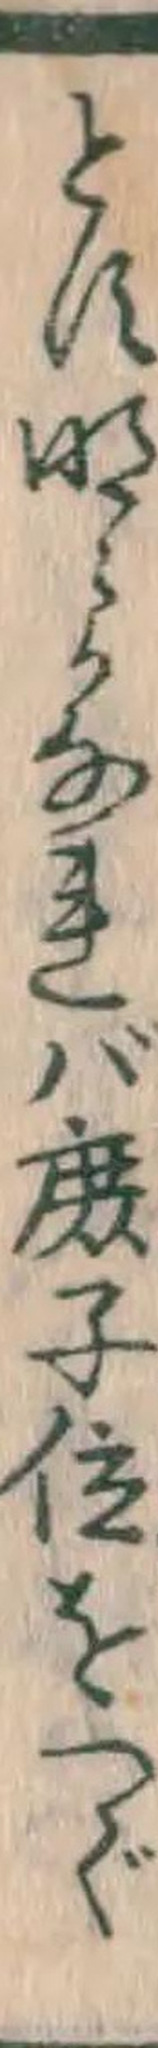とす明らかなれば庶子位をつぐ
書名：広益秘事大全 3巻. [2]
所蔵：国立国会図書館 National Diet Library, JAPAN
